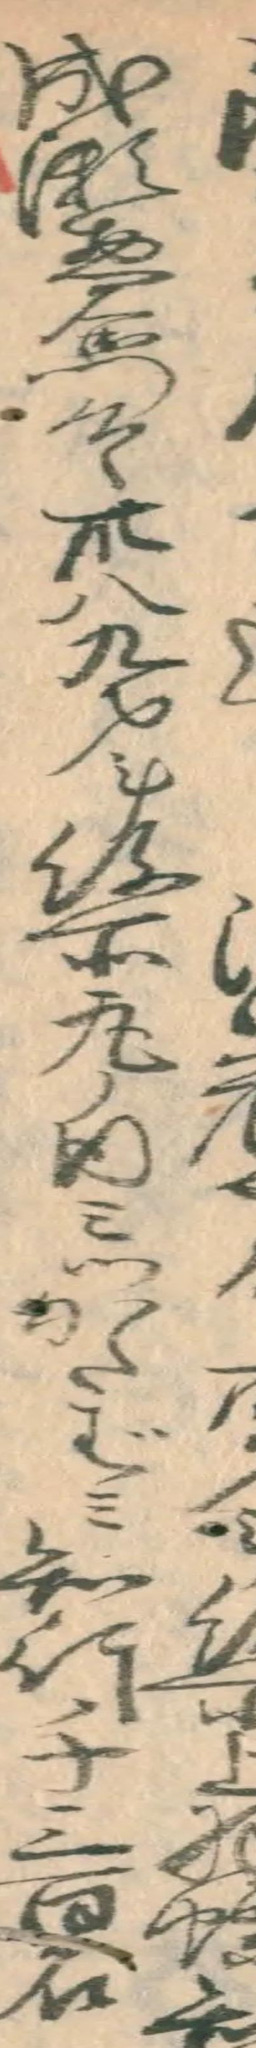成瀬惣右衛門殿卅八九才計紋所丸ノ内三ツかたばみ知行千三百石
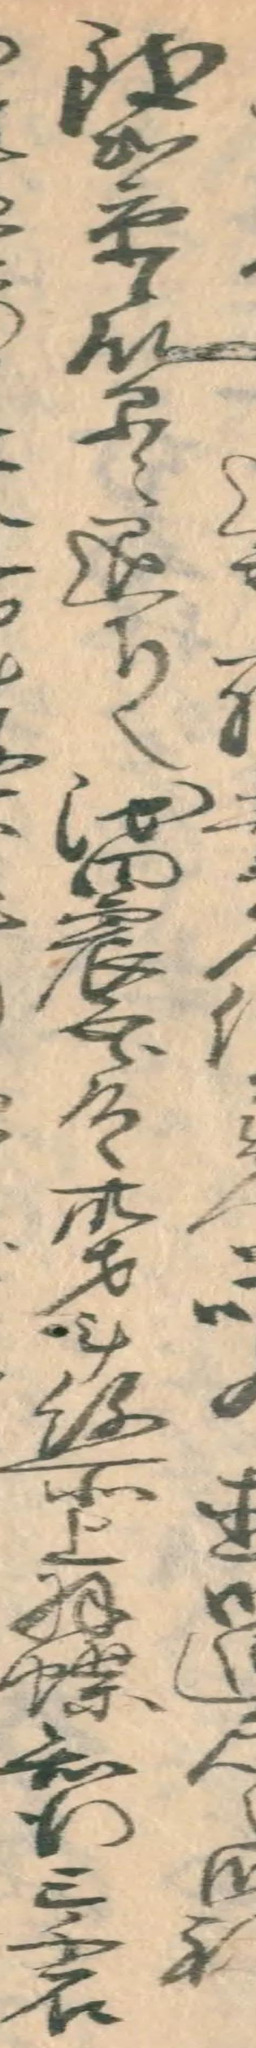致出京候故早々退下也池田震五郎殿卅才計紋所上羽螺知行三千石
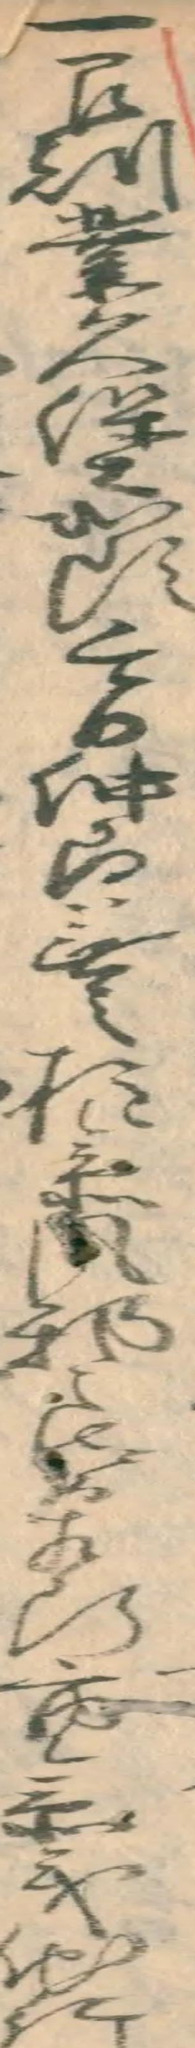一即刻業久保土出頭今日仲間ハ無之権兵衛風邪之由ニ而相断市兵衛義他行
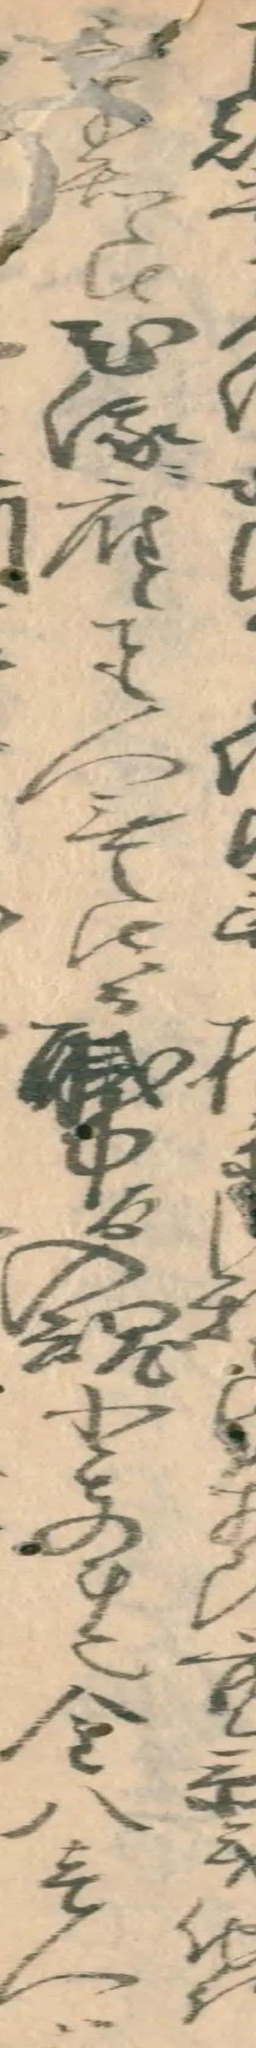不相知候由尤俄ニ雇候ても人無之由ニ而職中ゟ入魂小もの計也金八壱人ハ
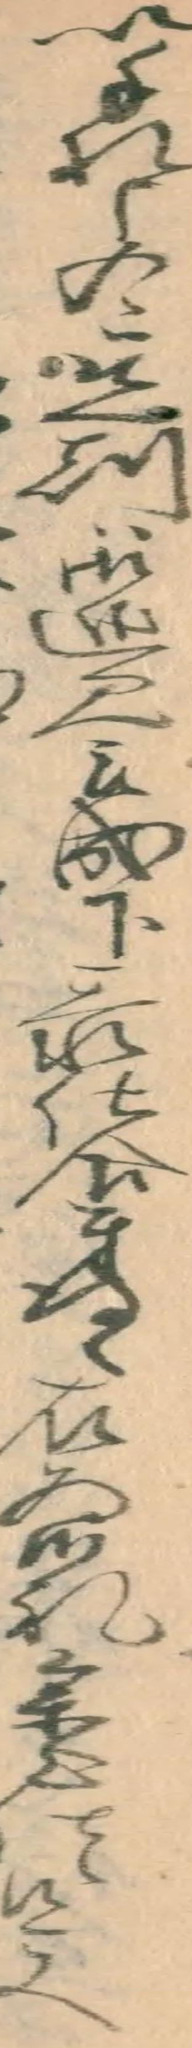以手札申入候ハ先刻ハ御巡見被成下忝仕合奉存候右為御礼参上仕候且又
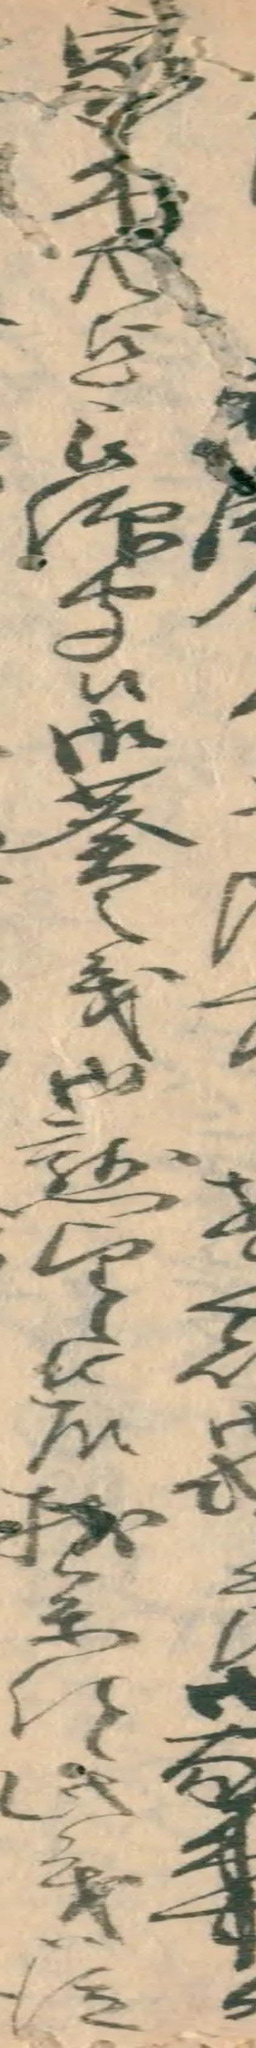家来共迄被仰聞候御葵之義御懇望之由故持参仕候此義ハ従
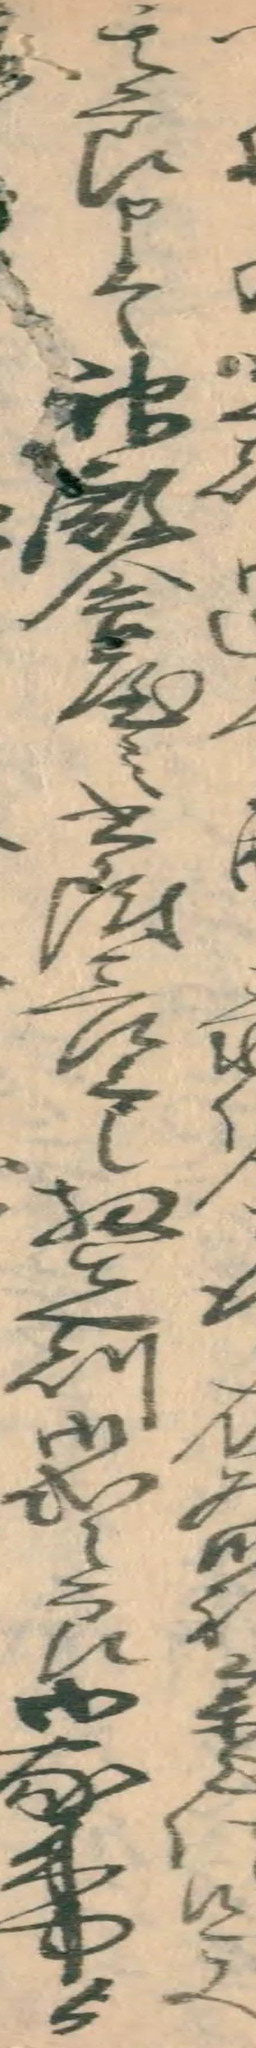其節申上候神殿舎屋之書付差上申候扨先刻御出之節御家来中ゟ
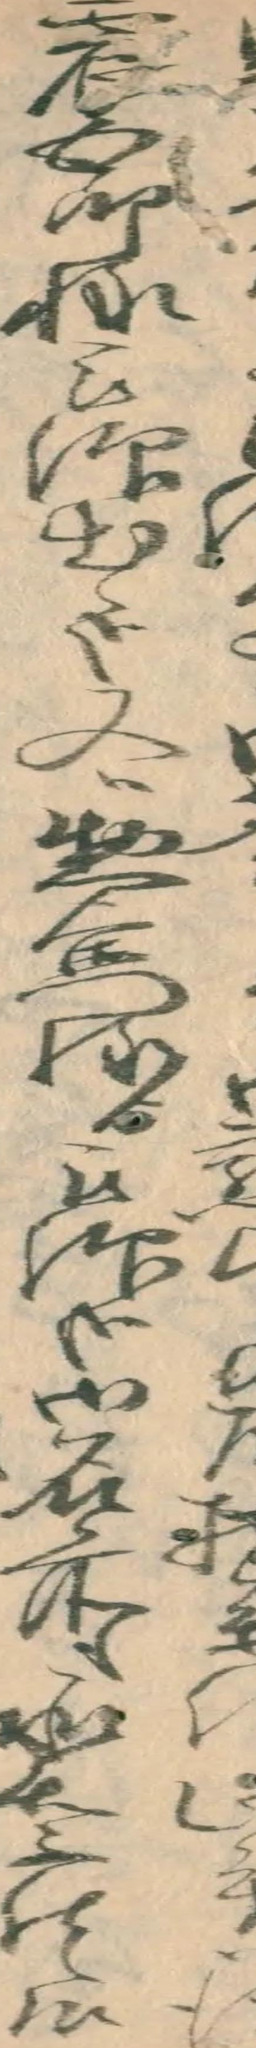震五御様被仰出候哉又ハ惣右衛門様ゟ被仰哉御名前も承知不仕候故
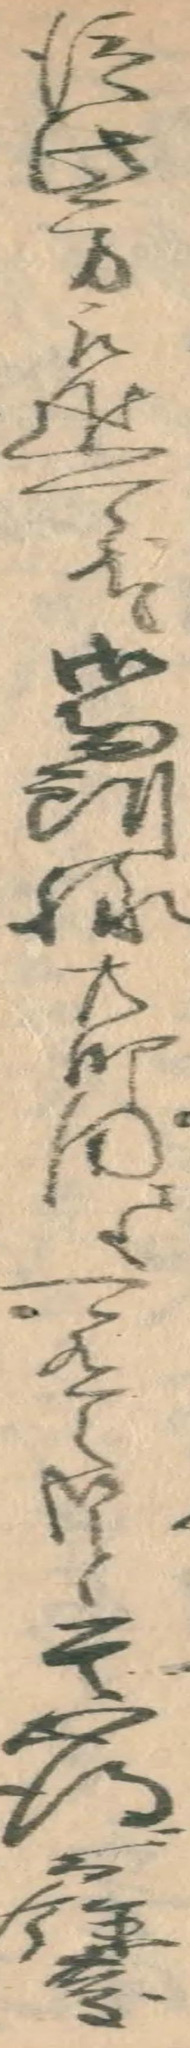従此方被進可被下候御両所様共御用ニも可有之哉と其心得ニ而余慶
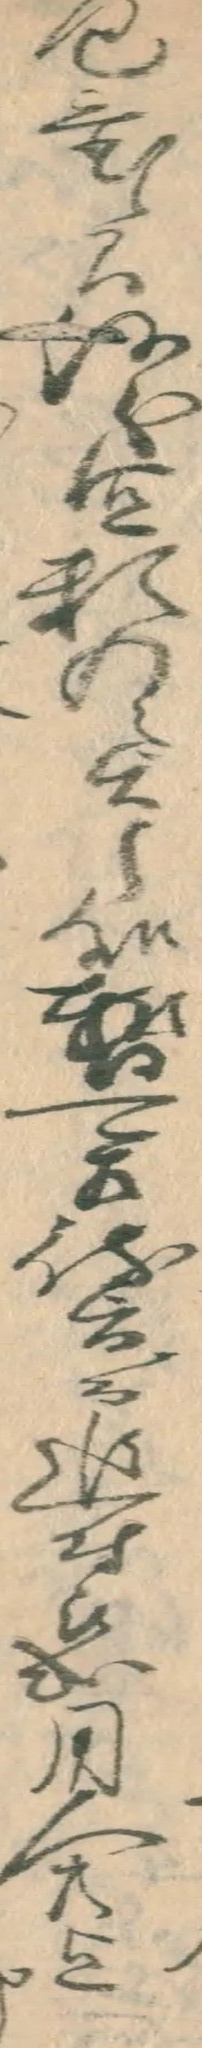包置候間何分宜頼入之旨申候処暫可被待旨ニ而追付被出用人共迄申
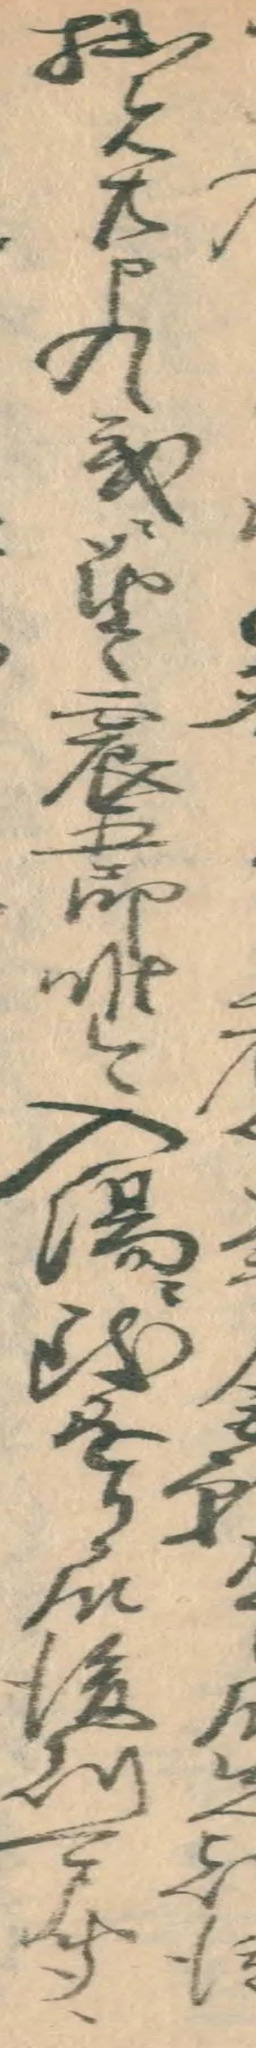拙者共申入候義ニ御座候震五郎唯今入湯ニ致懸り候故後刻可申聞候
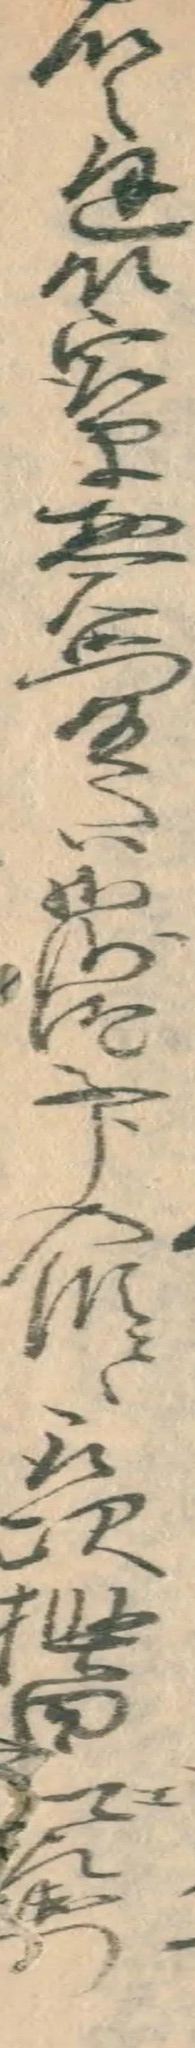右之通故最早惣右衛門殿へハ御沙汰不申入段ニ候取次樫田江左衛門
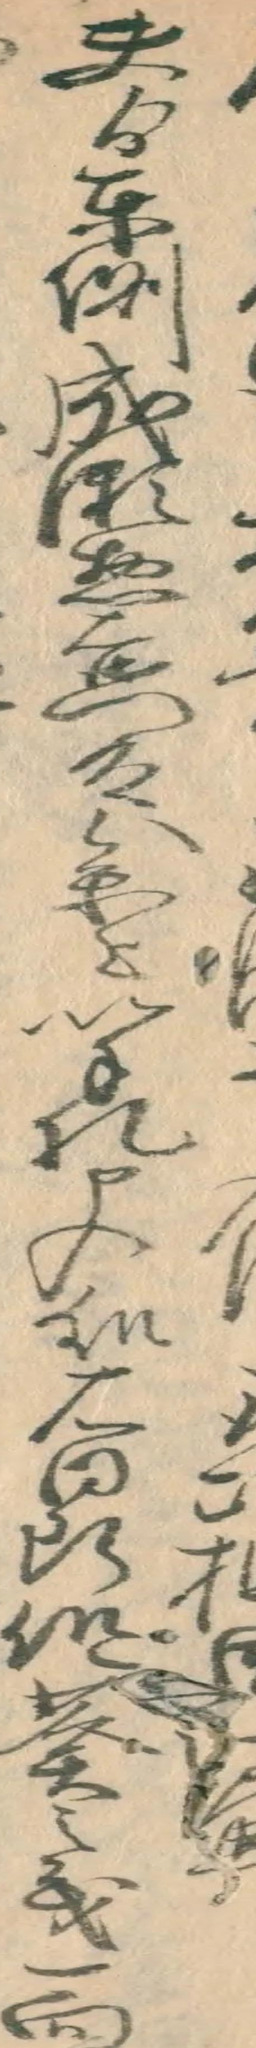夫ゟ東側成瀬惣右衛門殿へ参上以手札申入処右同断但葵之義一向
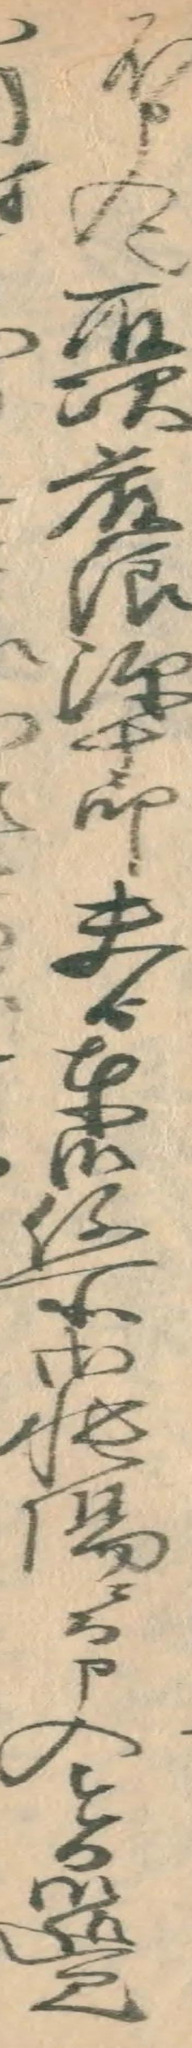不申入也取次藤浪源十郎夫ゟ東御役所御帳場ニ而申入今日御巡見
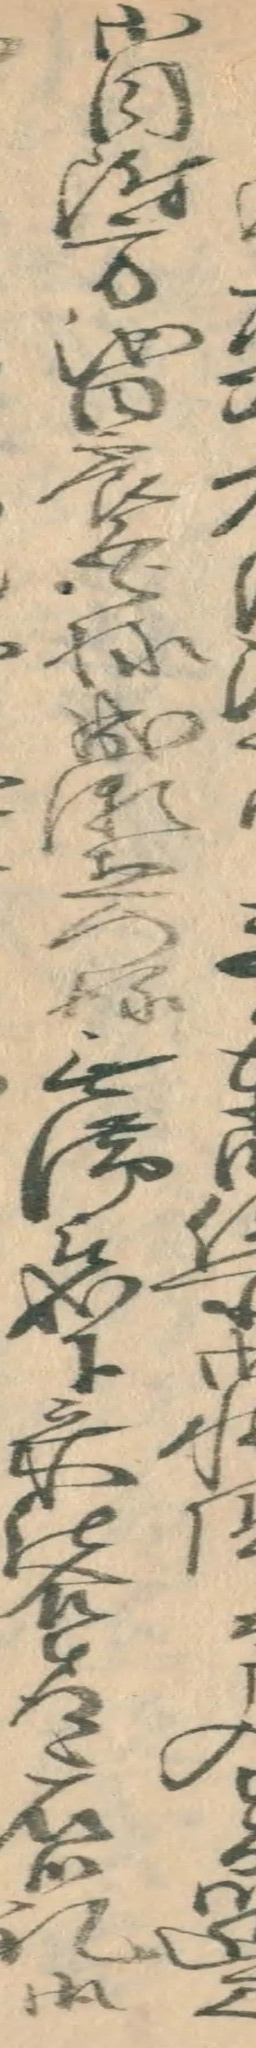御目付方池田震五郎様成瀬惣右衛門様無滞被成下忝仕合奉存候右御礼御
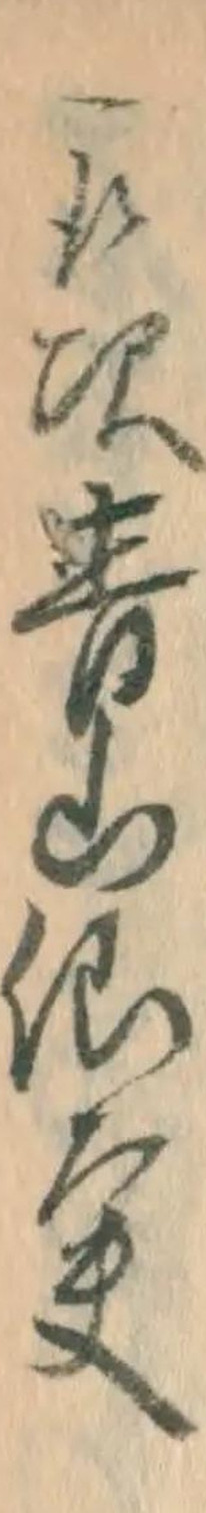取次青山仙大夫
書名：賀茂社記録. 第58冊
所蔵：国立国会図書館 National Diet Library, JAPAN
